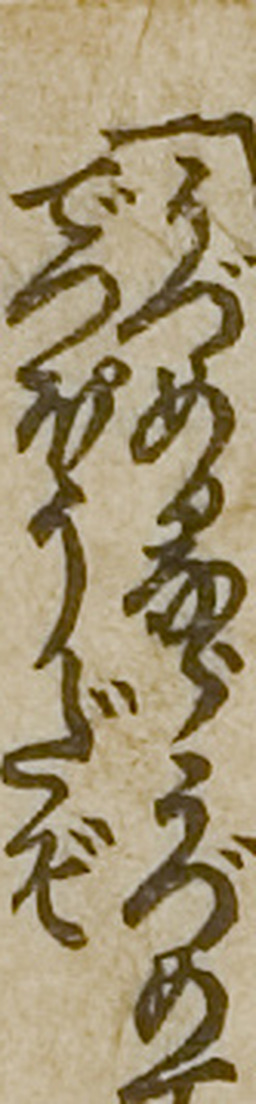でつぽうだぞ
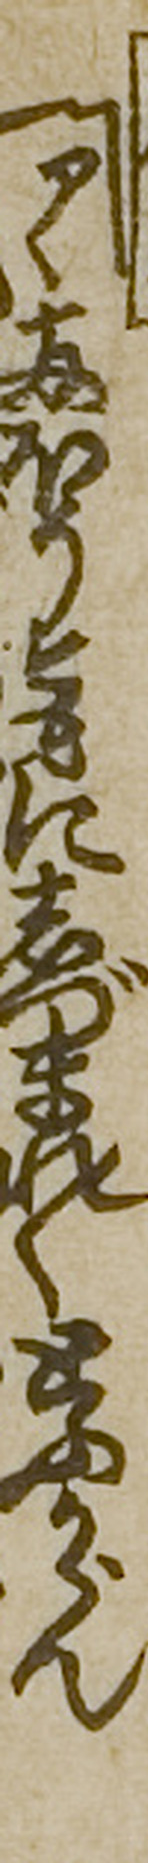アゝ両ほうともにしづまれしづまれとふからん
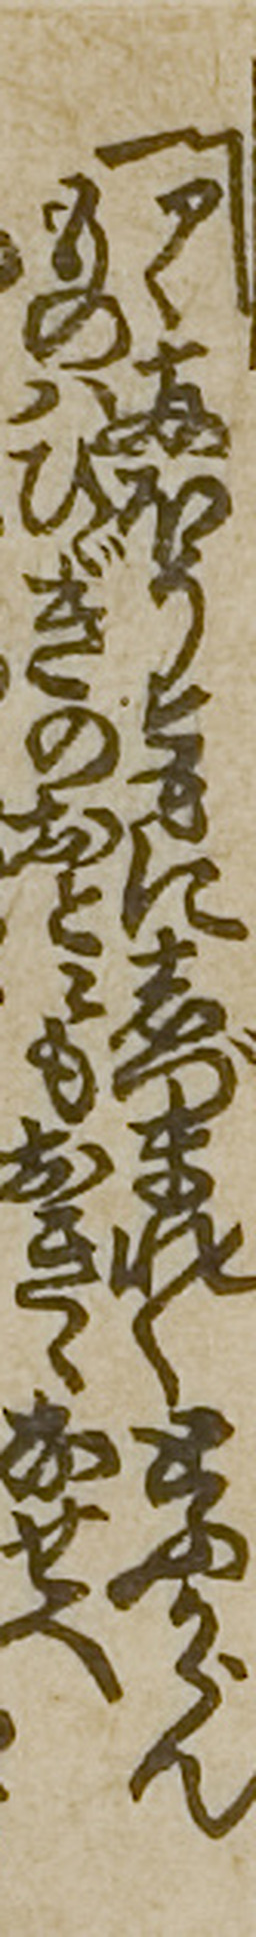ものはひゞきのおとにもおきゝなせへ
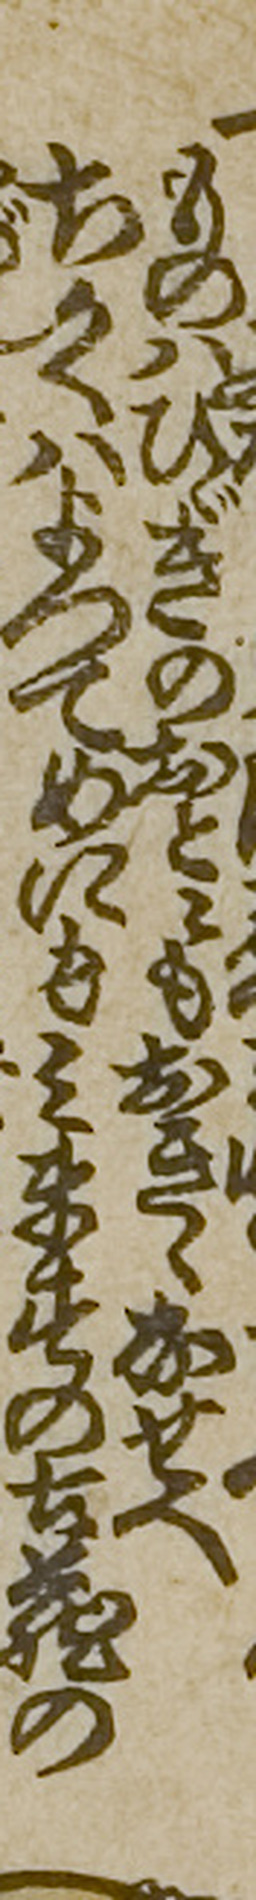ちかくはよつてめにもみますの土蔵の
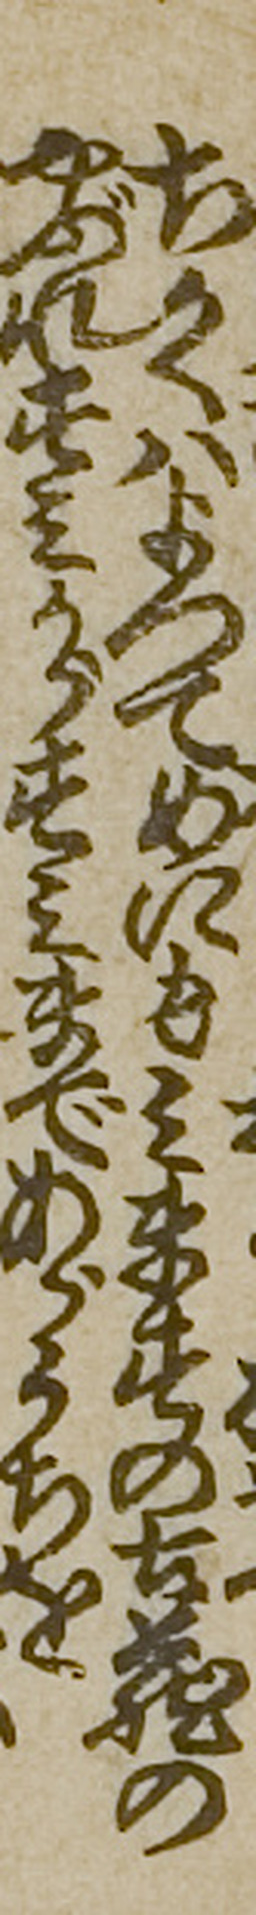やぶれすみうらすみまでめらうちを
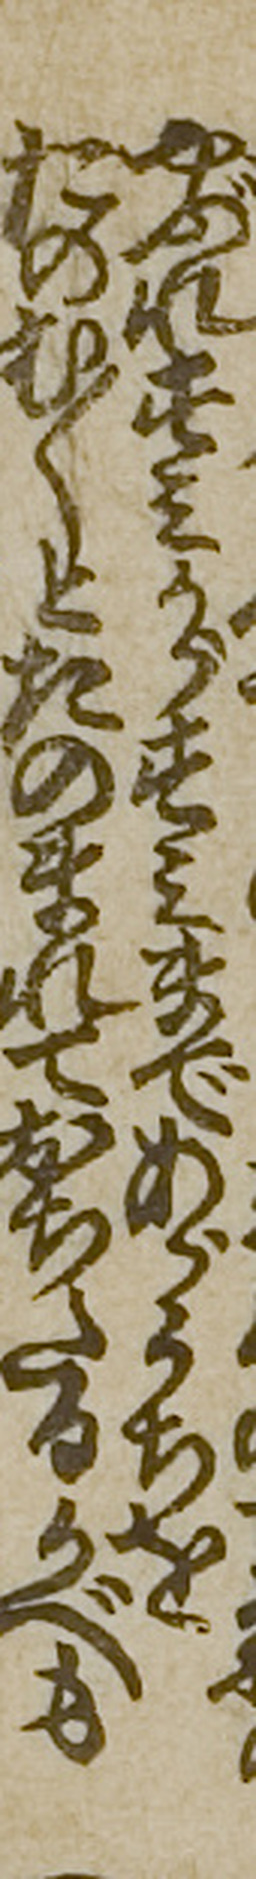たのむたのむとたのまれておちたるかべも
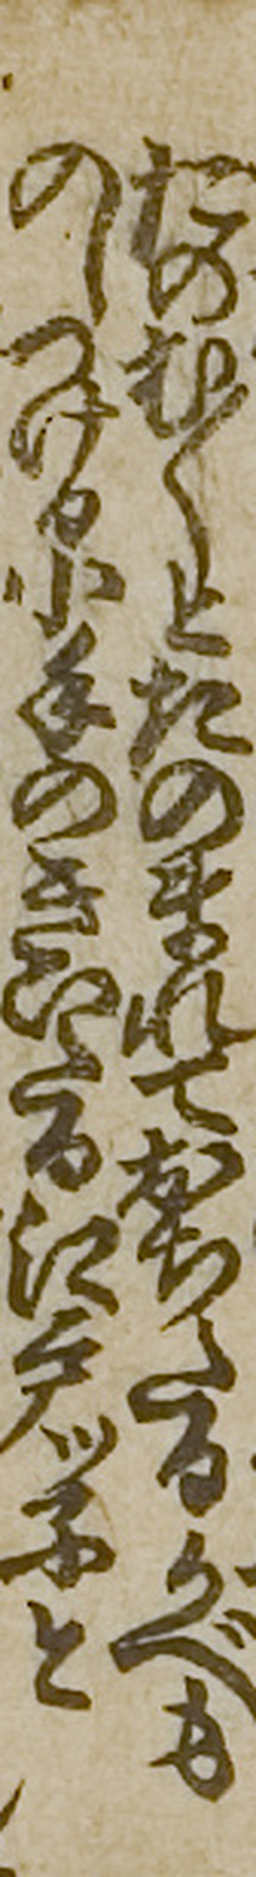のしつける小手のきいたる江戸ッ子と
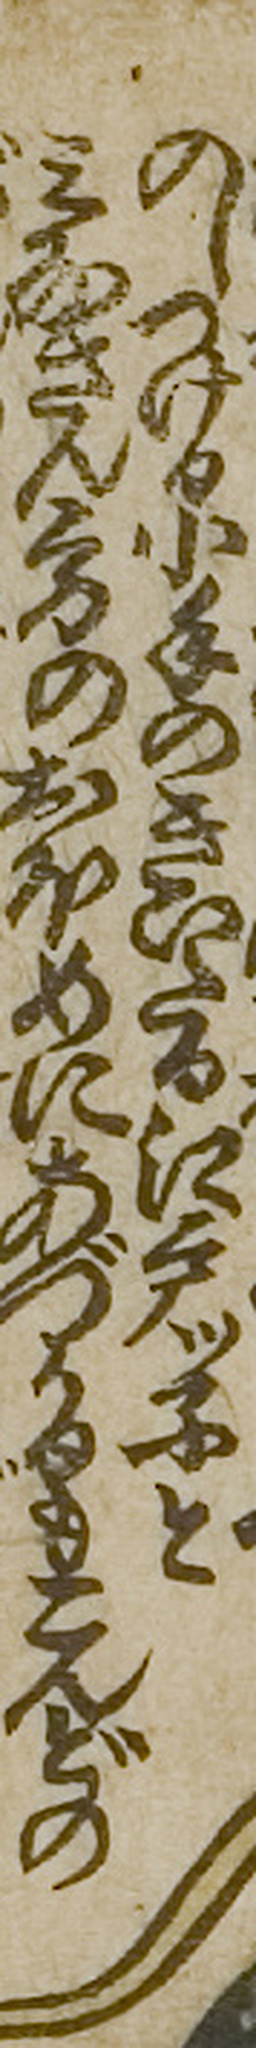みなさん方のおほめにあづかるもこんどの
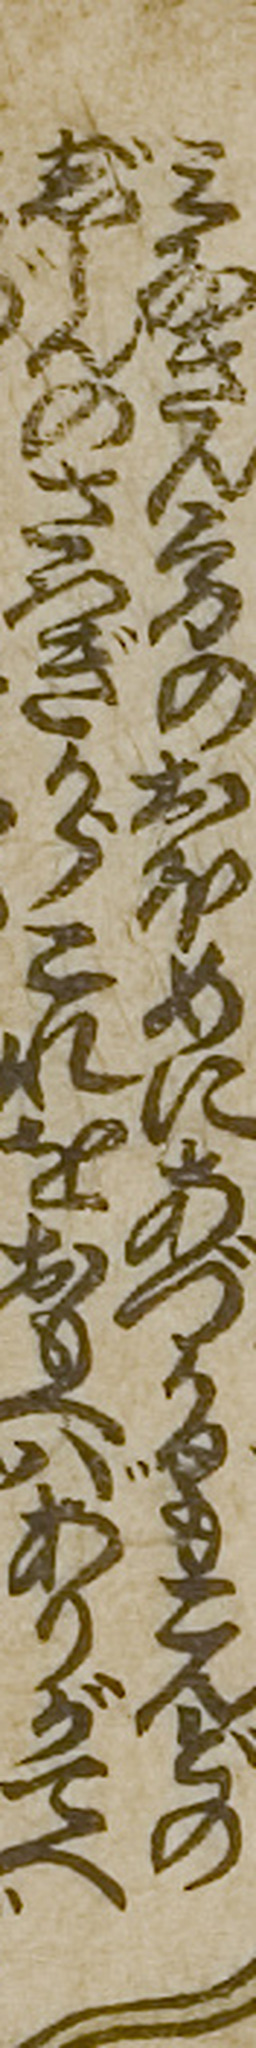じしんのさわぎからこれをおもへばありがてへ
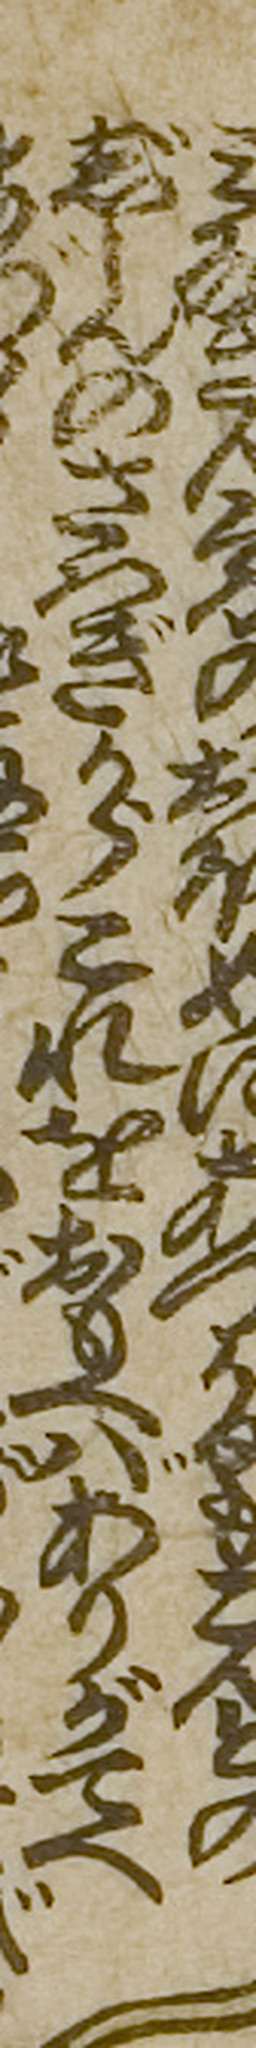じしんのさわぎからこれをおもへばありがてへ
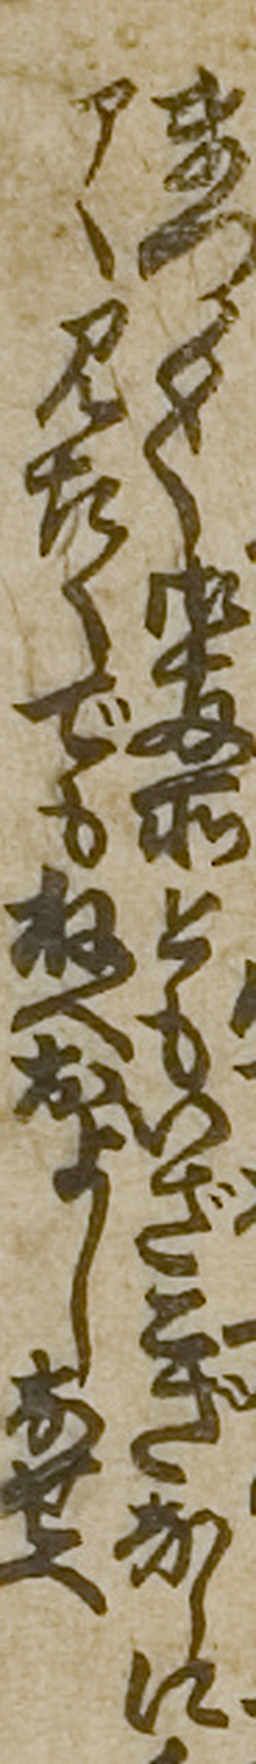あゝ見たくでもねへおよしなせへ
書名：安政二年十月二日夜大地震鯰問答
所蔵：東京大学総合図書館 General Library in the University of Tokyo, JAPAN
